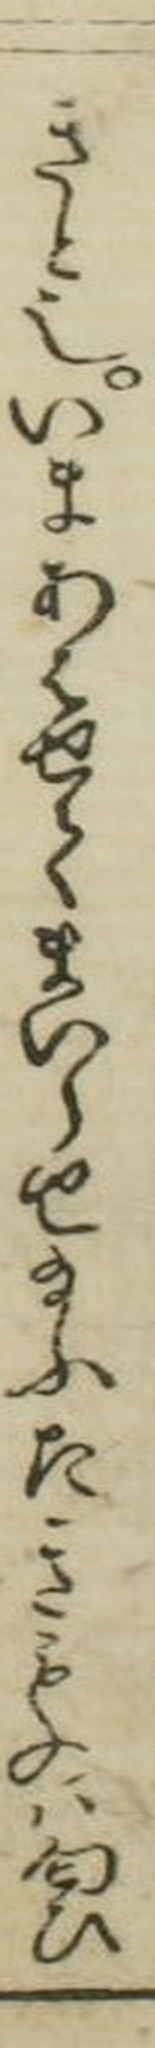きと也。いまあはせてまいらせ給ふたきものは匂ひ
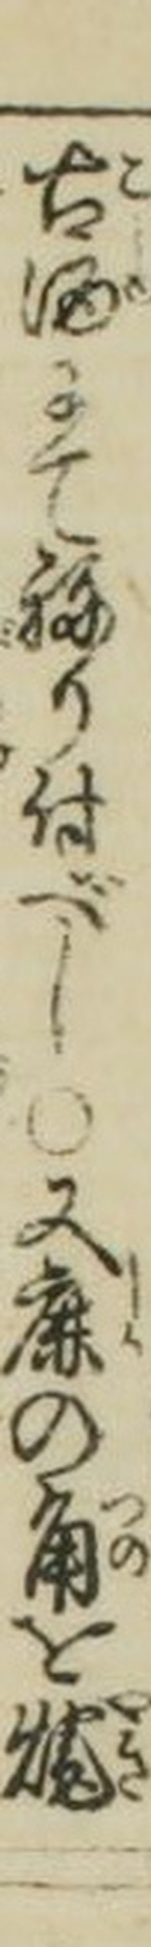古酒にてねり付べし◯又鹿の角を焼
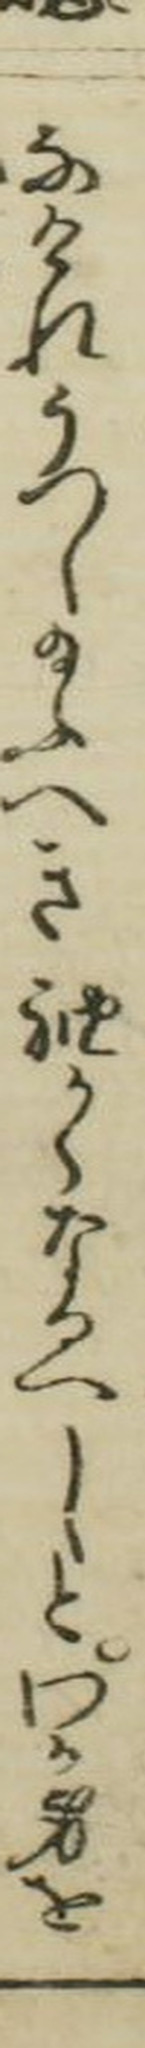なけれうつし給ふへき袖かくなるへしと。わか身を
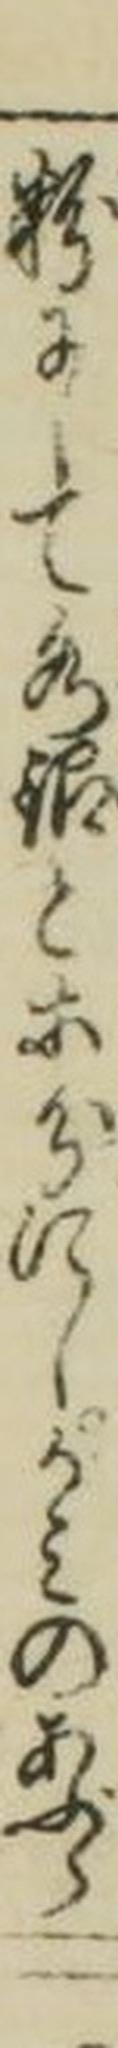粉にして水銀と等分にし。かみのあぶら
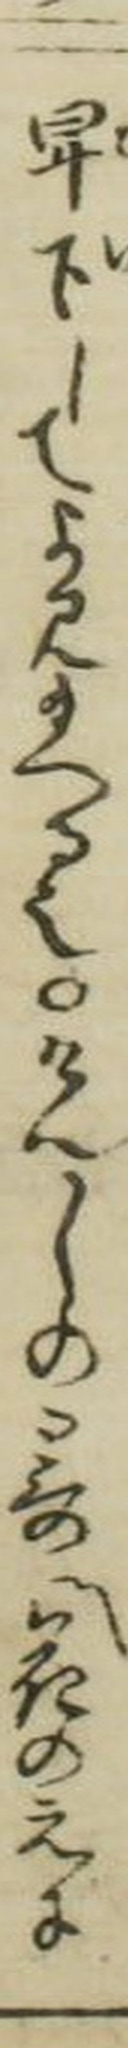卑下してよみ給へる也。けんしの御哥〽花のえに
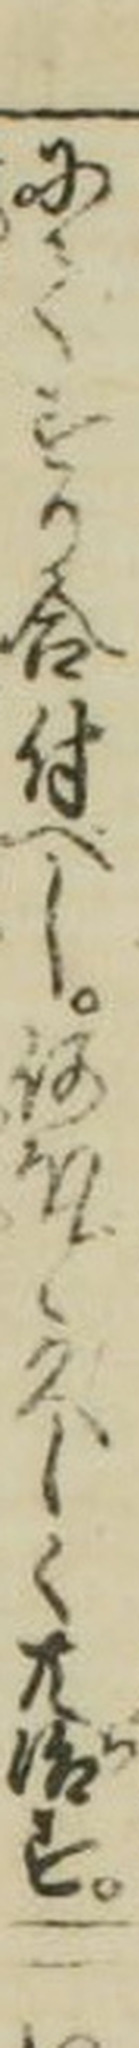にてすり合付べし。何ほど久しく共治す。
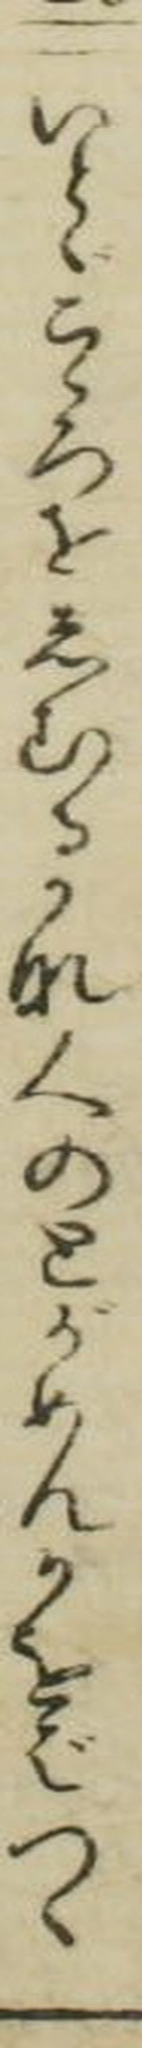いとゞこゝろをしむるかな人のとがめんかをばつゝ
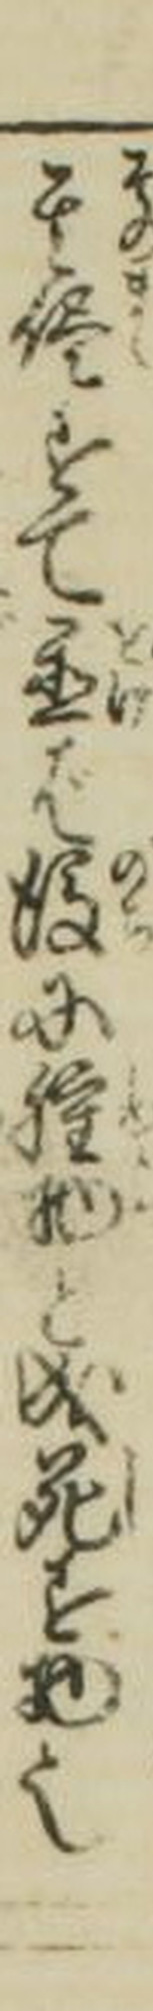其侭すて置ば後に腫物と成死す物也
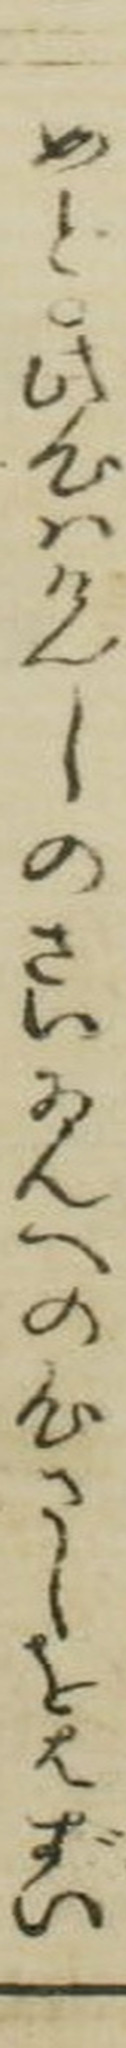めど◯此心はけんしにさいゐんへの心さしをはずい
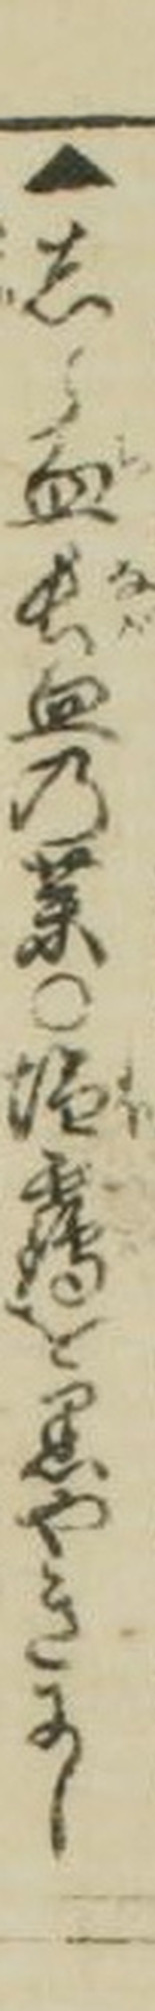▲しら血長血の薬◯塩鶴を黒やきにし
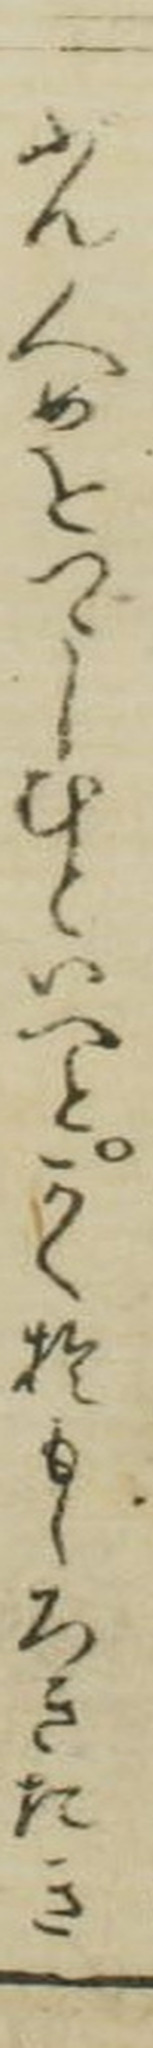ぶん人めをつゝしむといへと。かくおもしろきたき
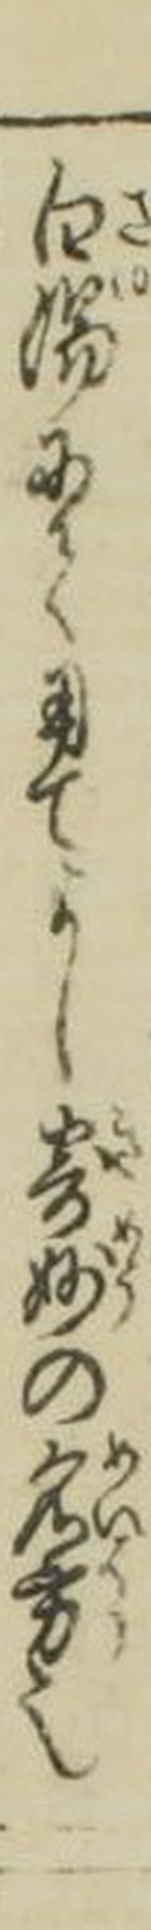白湯にて用てよし奇妙の名方也
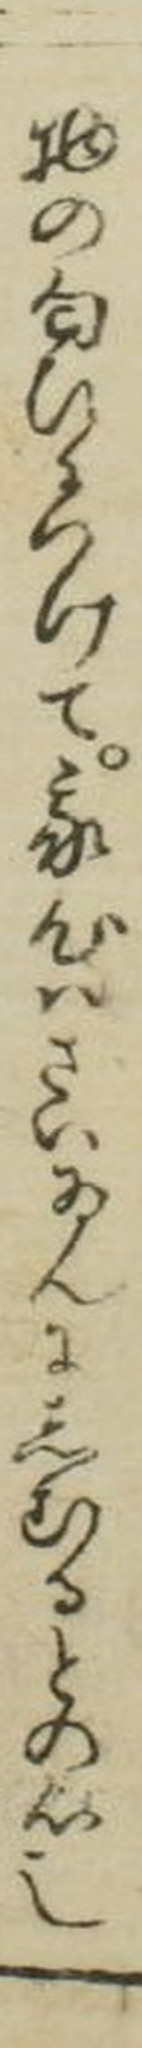物の匂ひにつけて。我心はさいゐんにしむるとの心也
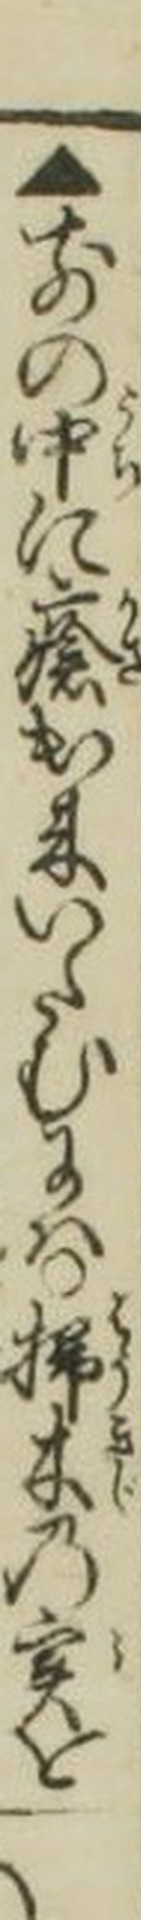▲前の中に瘡出来いたむには◯掃木の実を
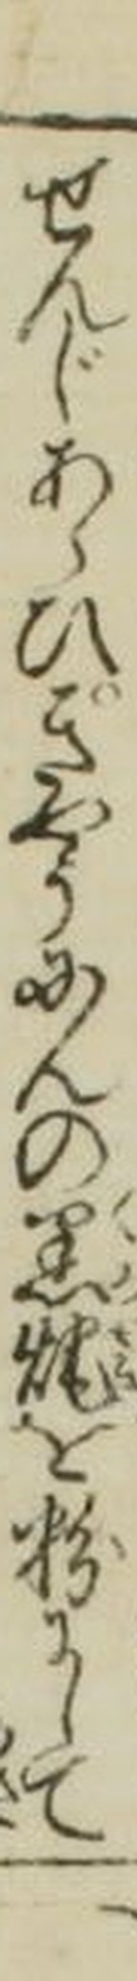せんじあらひ。きやうにんの黒焼を粉にして
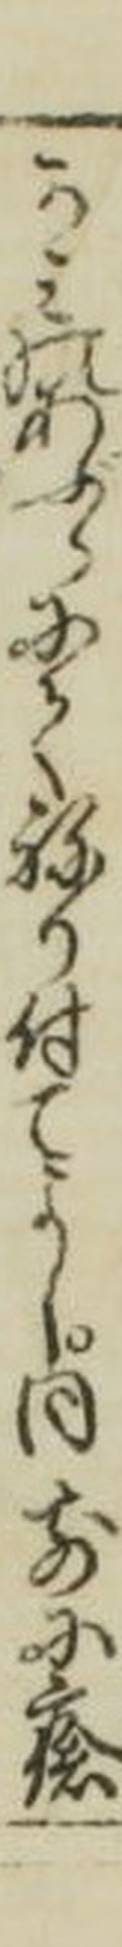かみのあぶらにてねり付てよし。同前に瘡
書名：女源氏教訓鑑
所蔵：東京学芸大学附属図書館
